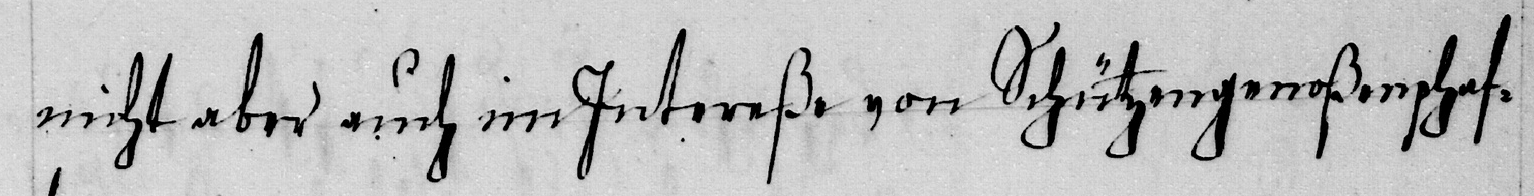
nicht aber auch im Intereße von Schützengenoßenschaf¬
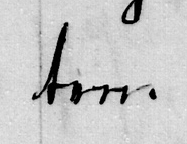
ten.
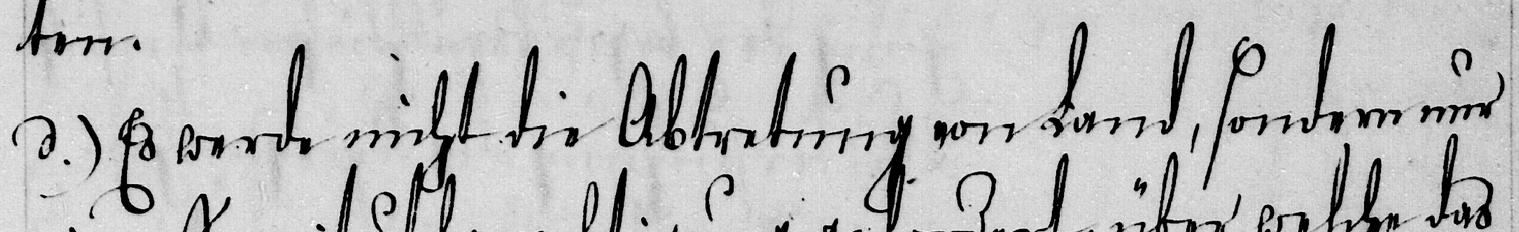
d.) Es werde nicht die Abtretung von Land, sondern nur
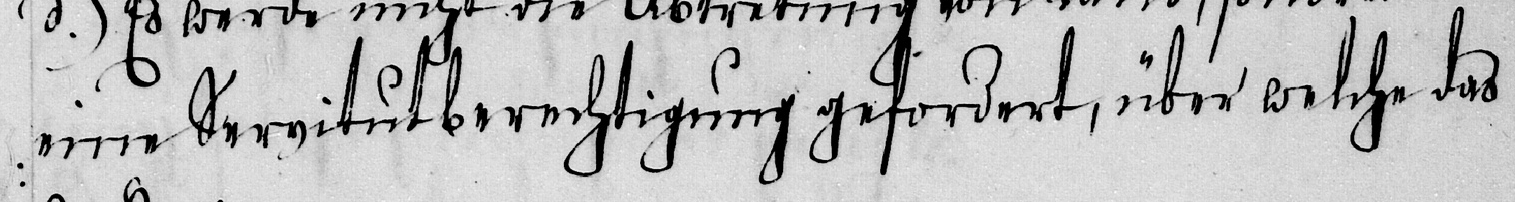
eine Servitutberechtigung gefordert, über welche das
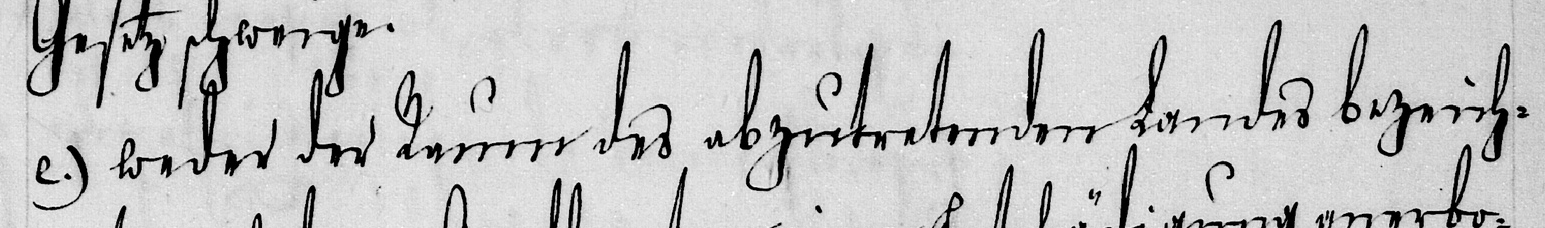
e.) weder der Raum des abzutretenden Landes bezeich¬
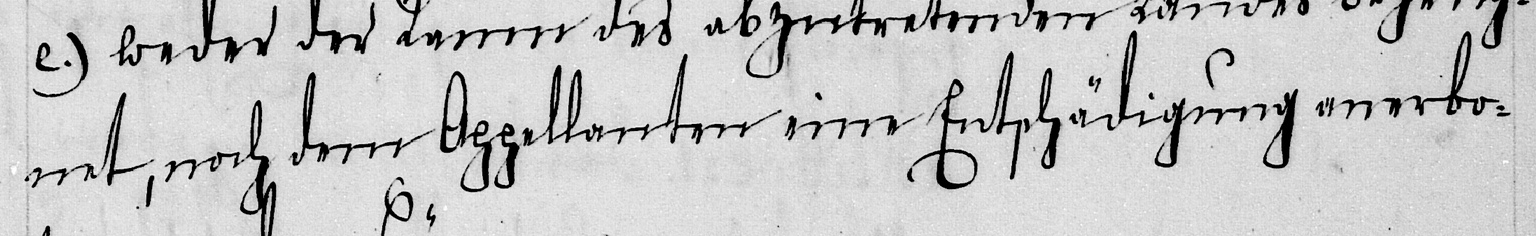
net, noch dem Appellanten eine Entschädigung anerbo¬
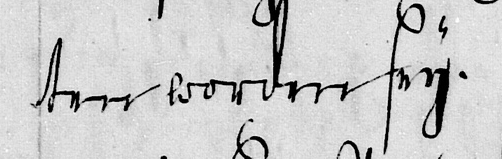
ten worden sey.
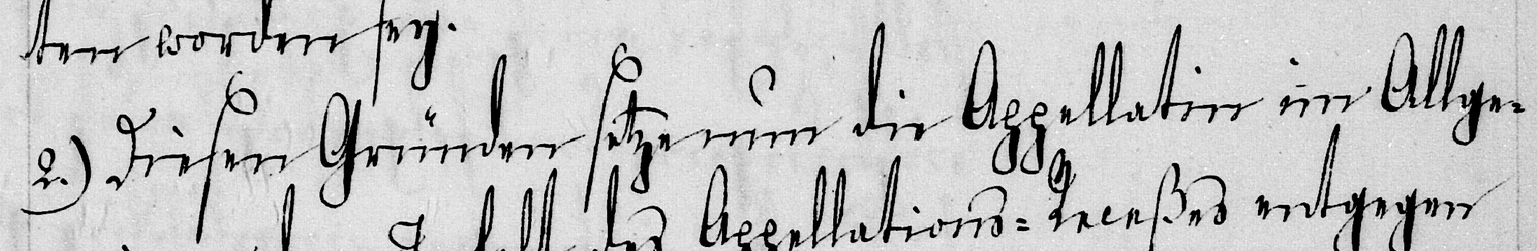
2.) Diesen Gründen setze nun die Appellatin im Allge¬
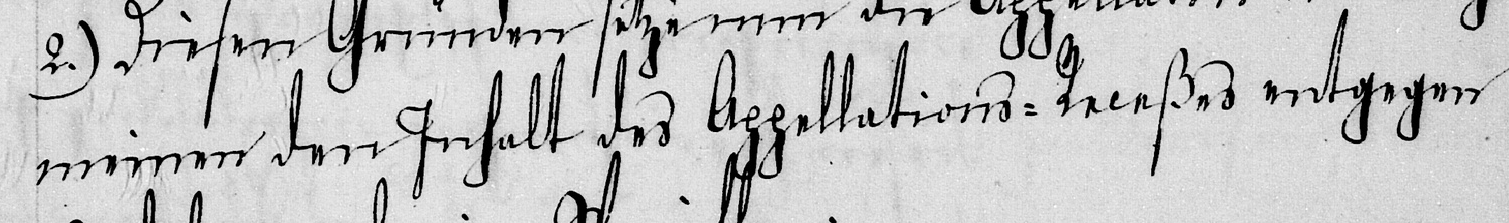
meinen den Inhalt des Appellations-Receßes entgegen
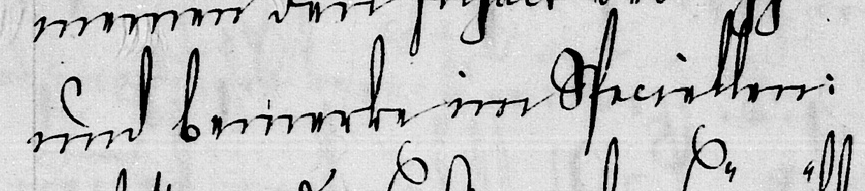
und bemerke im Speziellen:
